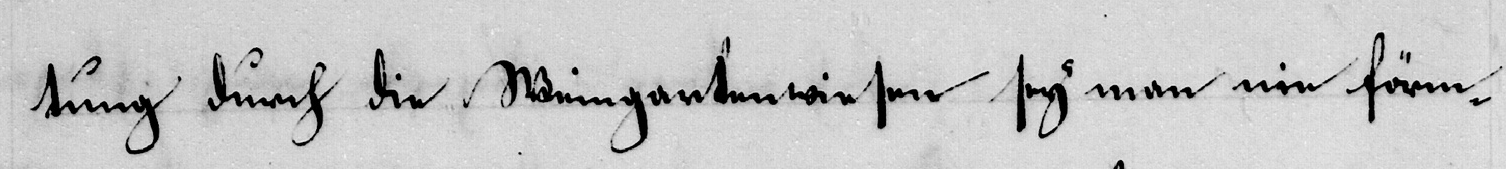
tung durch die Weingartenwiesen sey man nie förm¬
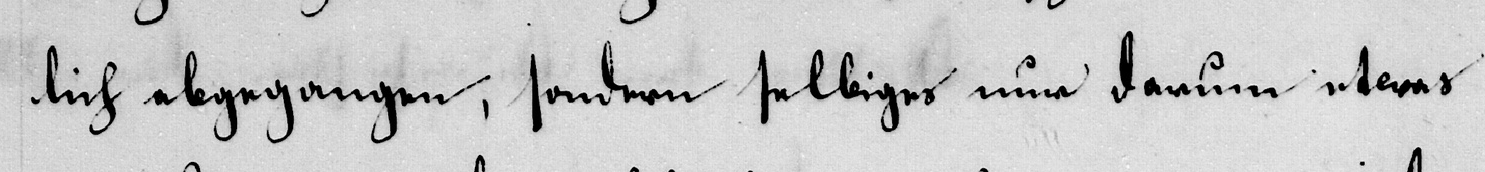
lich abgegangen, sondern selbiges nur darum etwas
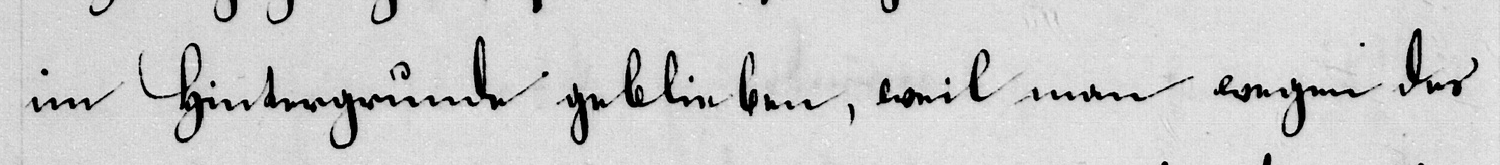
im Hintergrunde geblieben, weil man wegen des
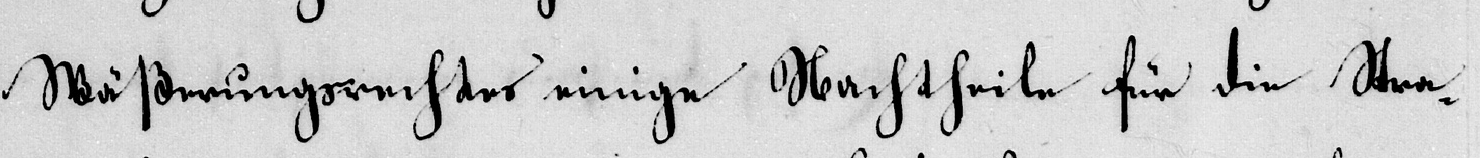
Wäßerungsrechtes einige Nachtheile für die Stra¬
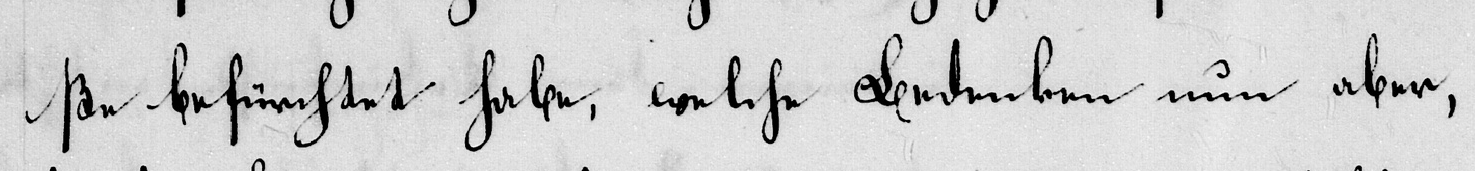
ße befürchtet habe, welche Bedenken nun aber,
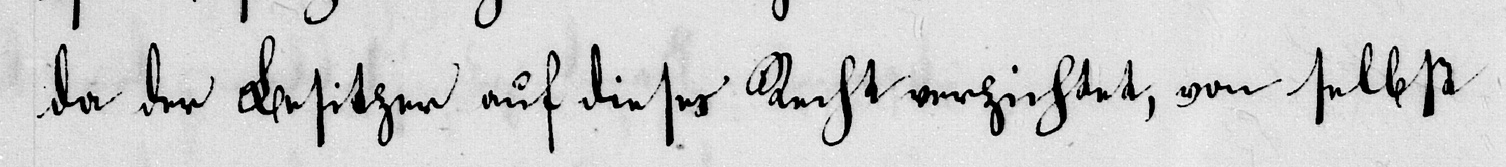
da der Besitzer auf dieses Recht verzichtet, von selbst
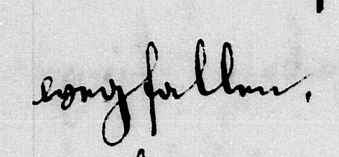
wegfallen.
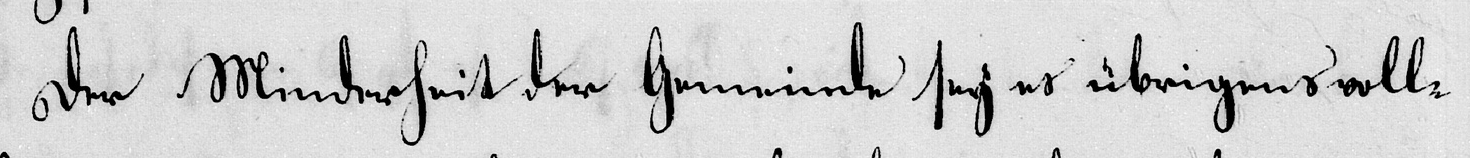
Der Minderheit der Gemeinde sey es übrigens voll¬
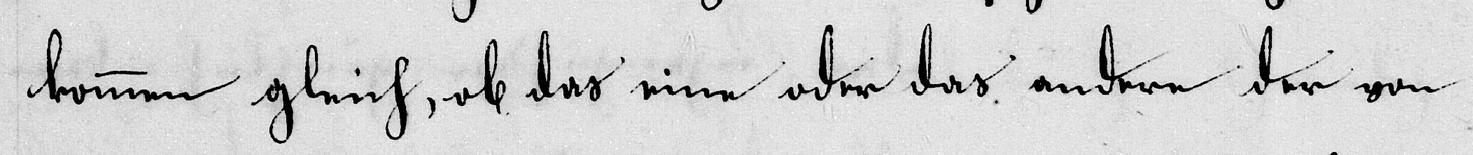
kommen gleich, ob das eine oder das andere der von
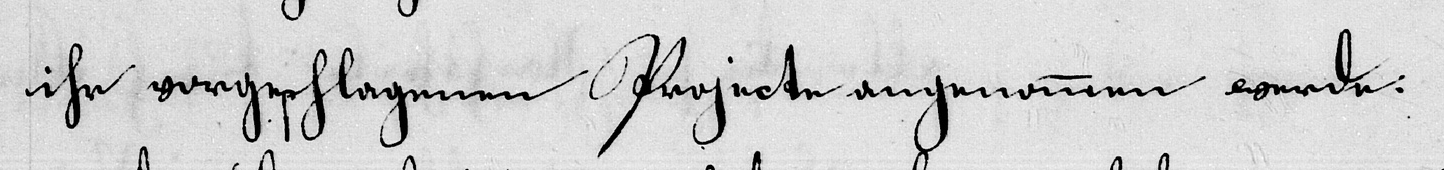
ihr vorgeschlagenen Projecte angenommen werde.
